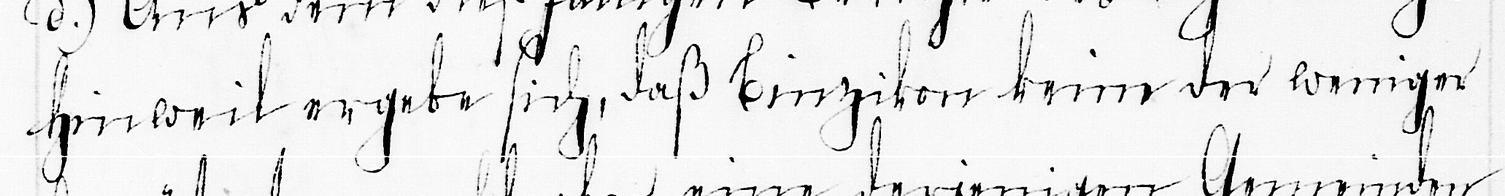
Hinweil ergebe sich, daß Binzikon keine der weniger
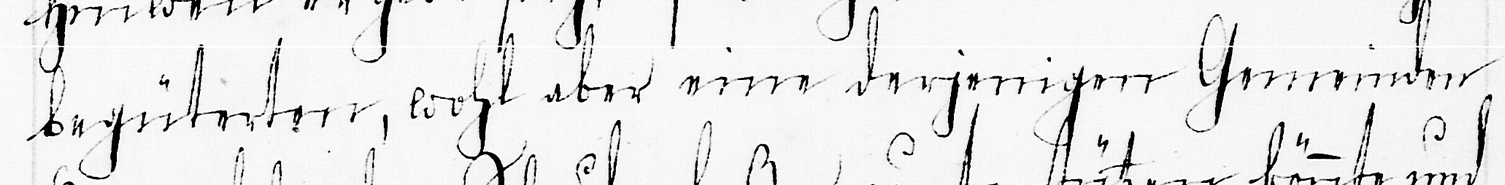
begüterten, wohl aber eine derjenigen Gemeinden
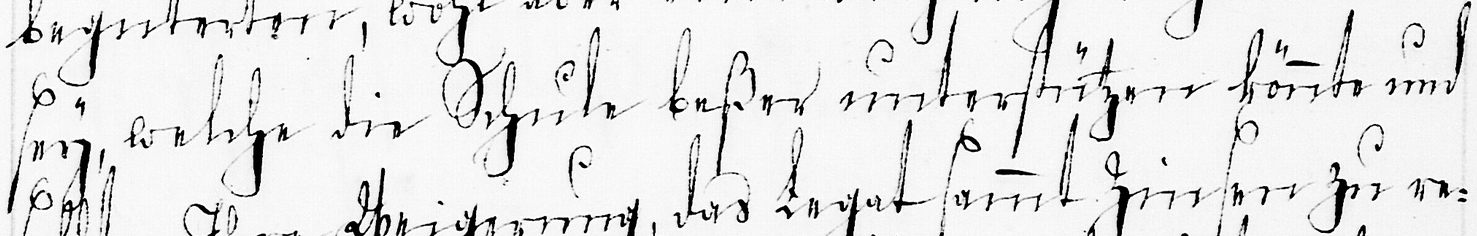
sey, welche die Schule beßer unterstützen könnte und
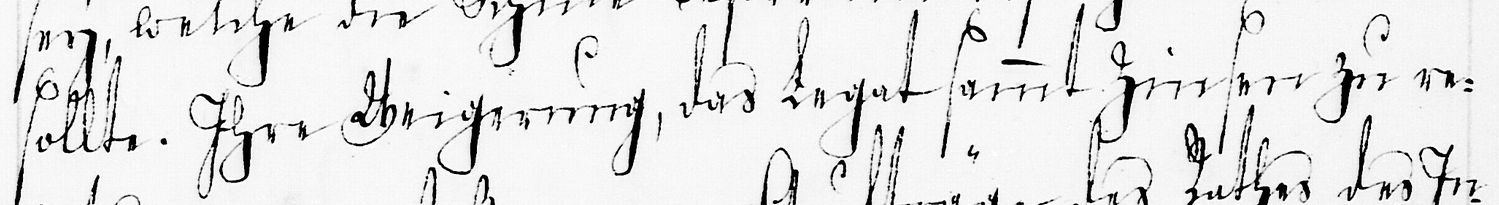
sollte. Ihre Weigerung, das Legat sammt Zinsen zu re¬
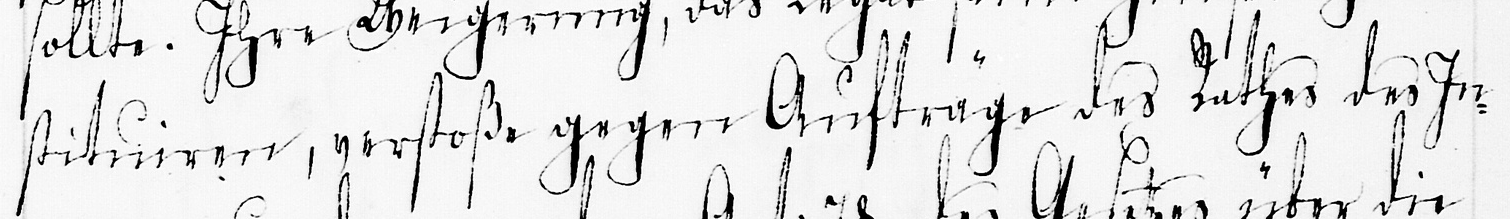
stituiren, verstoße gegen Aufträge des Rathes des In¬
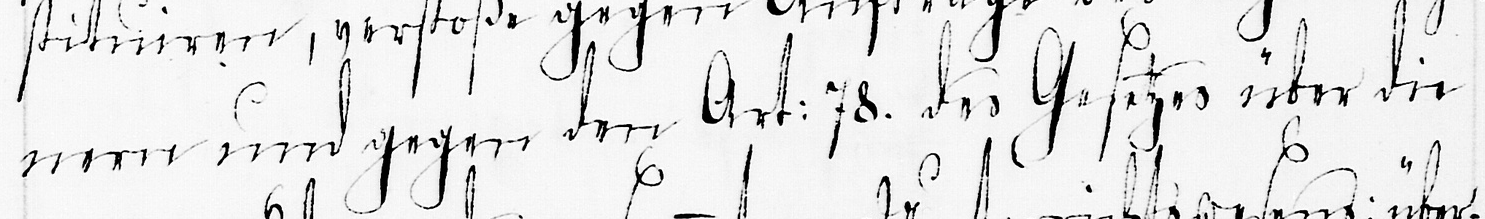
nern und gegen den Art: 78. des Gesetzes über die
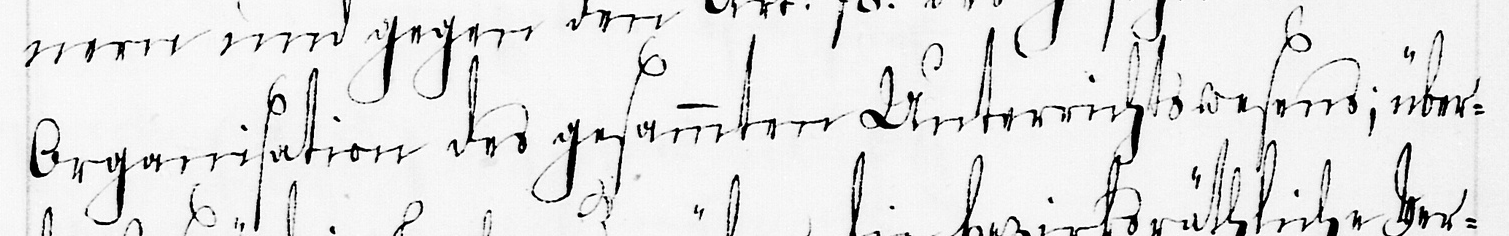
Organisation des gesammten Unterrichtswesens; über¬
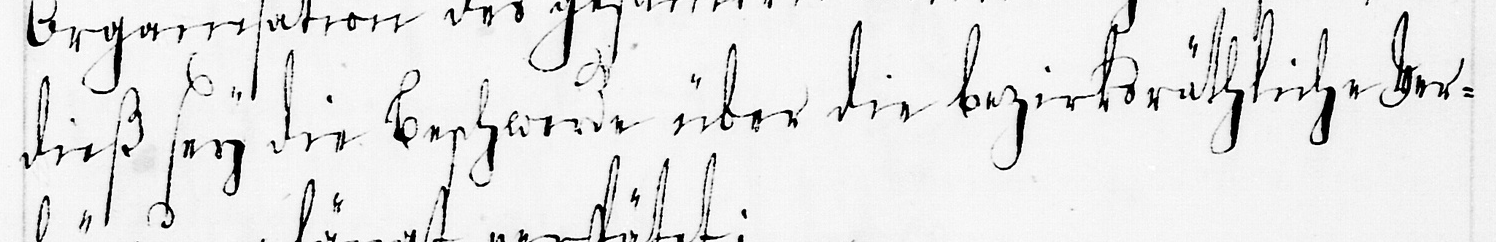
dieß sey die Beschwerde über die bezirksräthliche Ver¬
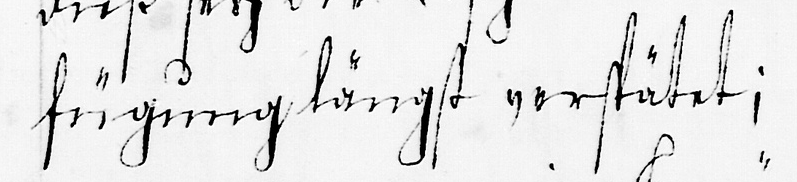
fügung längst verspätet;
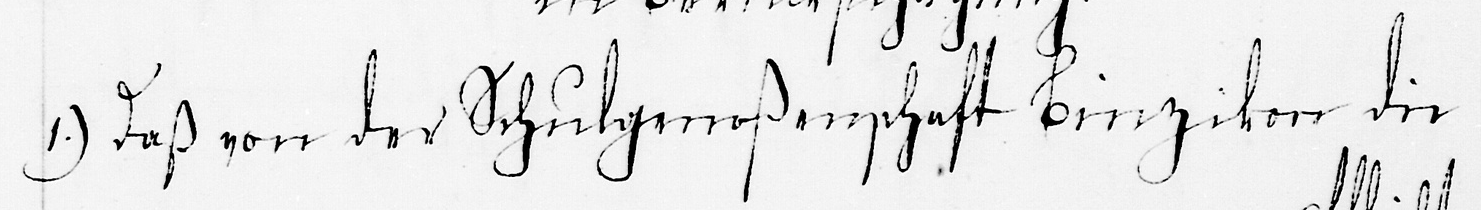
1.) Daß von der Schulgenoßenschaft Binzikon die
